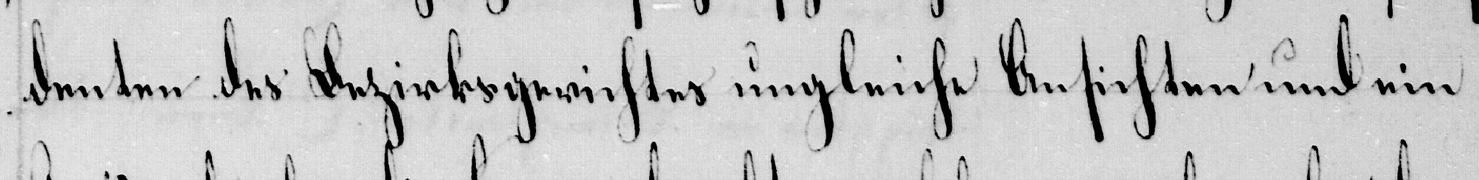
denten des Bezirksgerichtes ungleiche Ansichten und ein
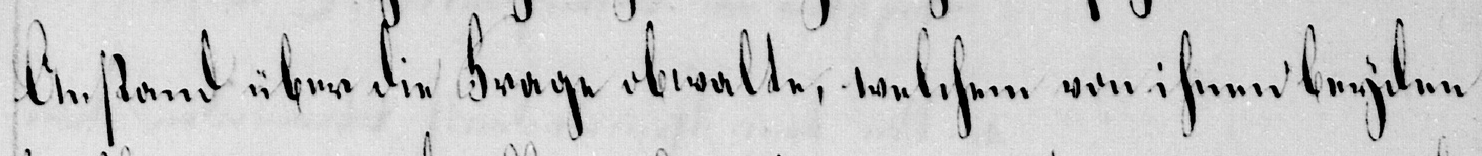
Anstand über die Frage obwalte, welchem von ihnen beyden
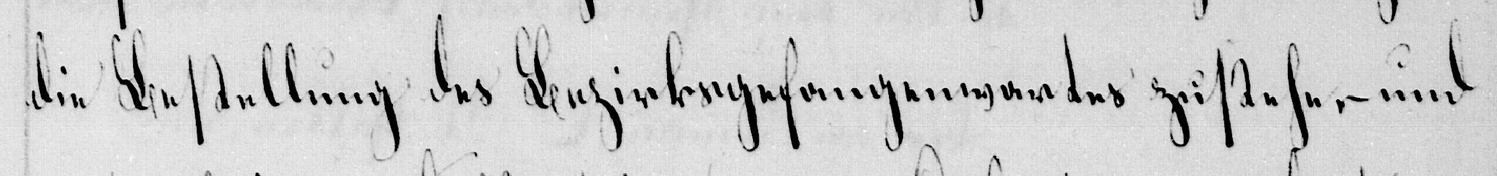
die Bestellung des Bezirksgefangenwartes zustehe, – und
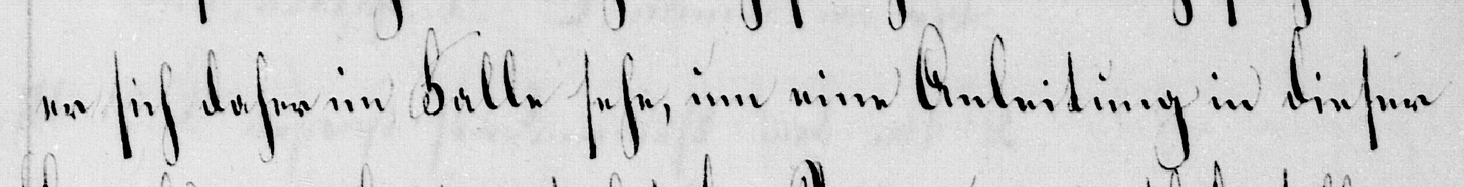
er sich daher im Falle sehe, um eine Anleitung in dieser
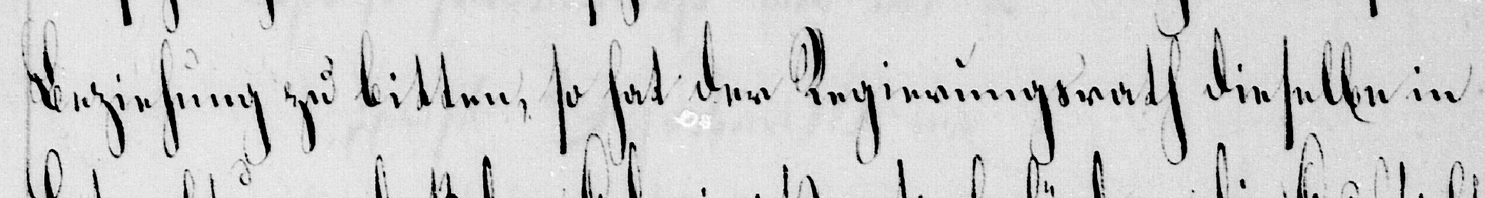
Beziehung zu bitten, so hat der Regierungsrath dieselben in
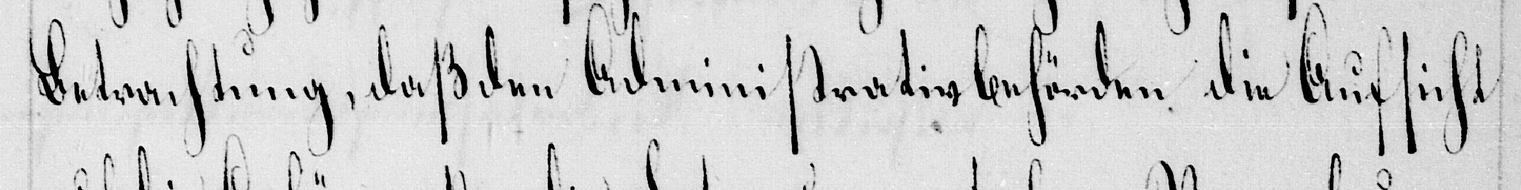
Betrachtung, daß den Administrativbehörden die Aufsicht
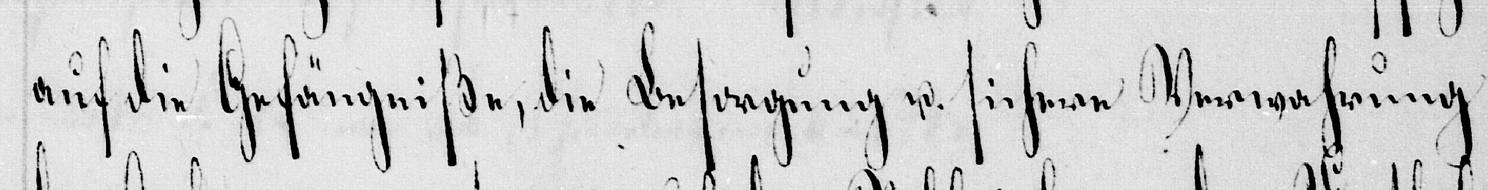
auf die Gefängniße, die Besorgung u. sichere Verwahrung
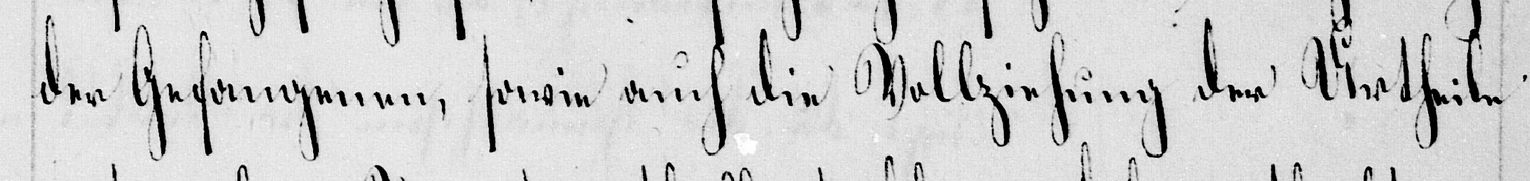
der Gefangenen, sowie auf die Vollziehung der Urtheile
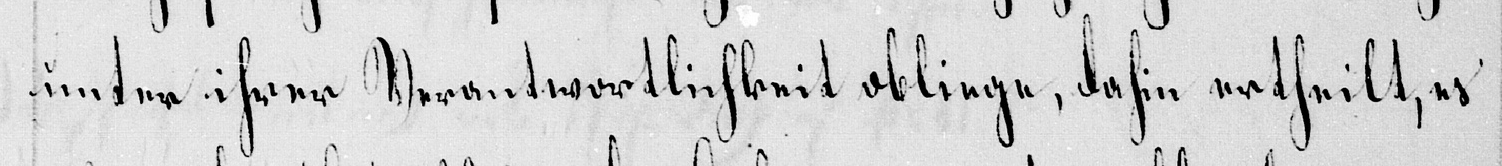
unter ihrer Verantwortlichkeit obliege, dahin ertheilt, es
